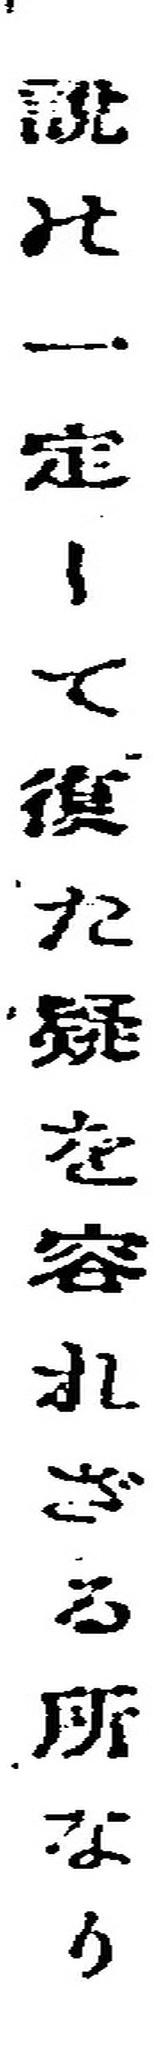説の一定して復た疑を容れざる所なり
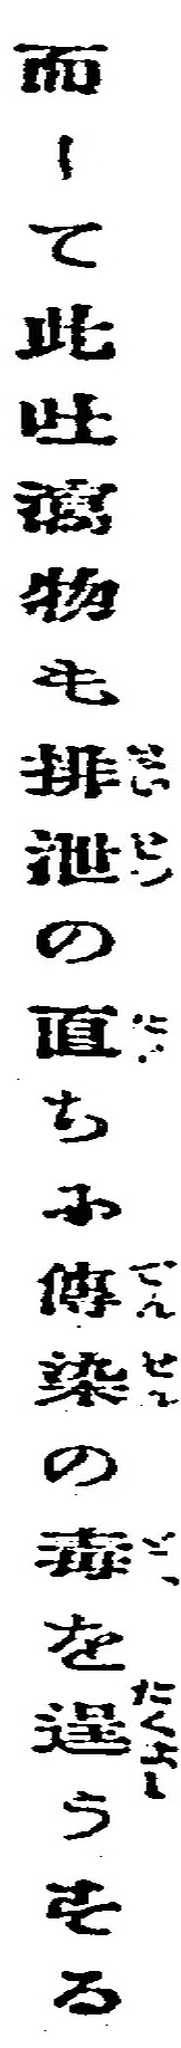而して此吐瀉物も排泄の直ちに伝染の毒を逞うする
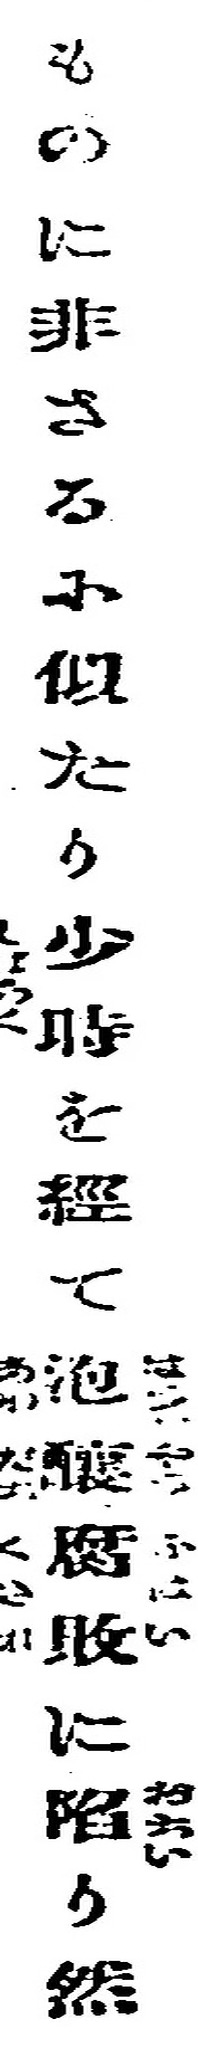ものに非さるに似たり少時を経て泡醸腐敗に陥り然
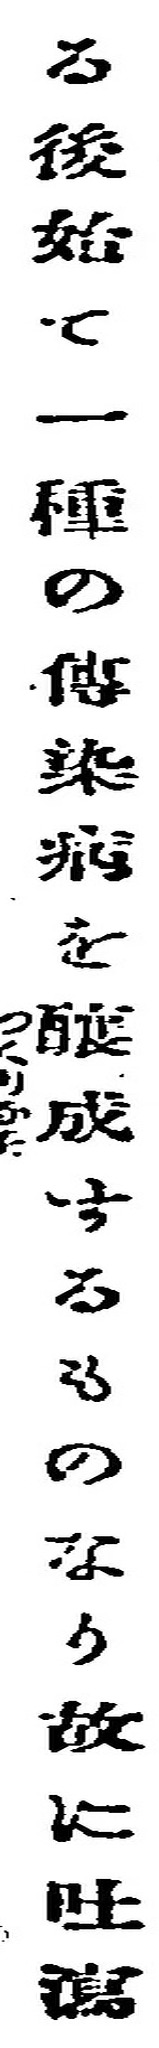る後始て一種の伝染病を醸成するものなり故に吐瀉
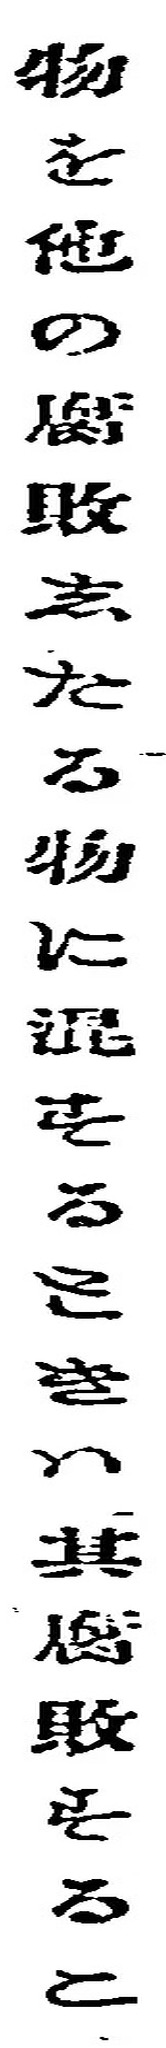物を他の腐敗したる物に混するときは其腐敗するこ
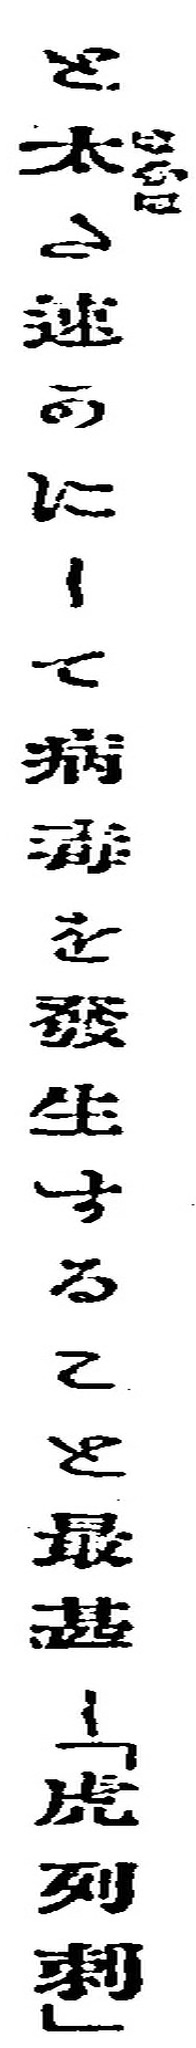と太た速かにして病毒を発生すること最甚し「虎列刺」
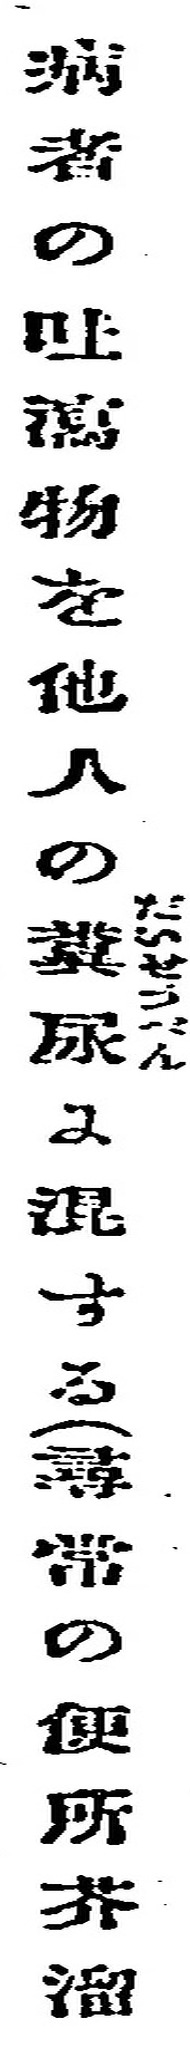病者の吐瀉物を他人の糞尿に混する(尋常の便所芥溜
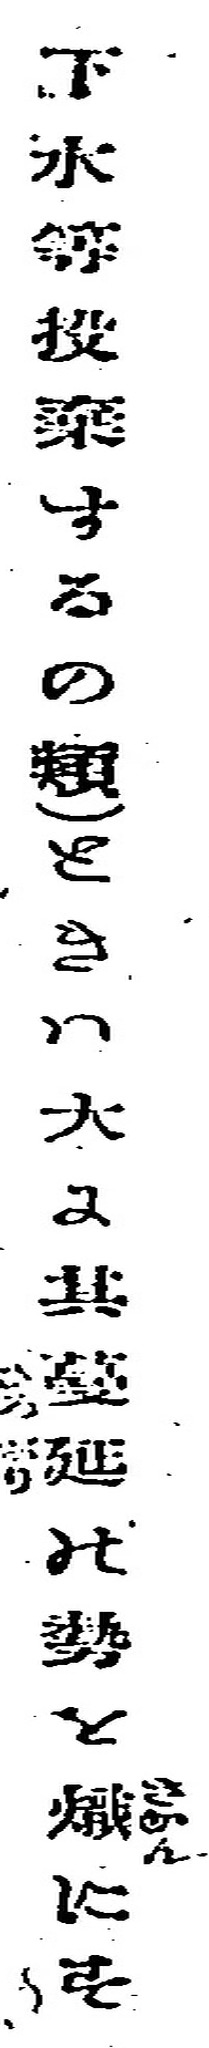下水等投棄するの類)ときは大に其蔓延の勢を熾にす
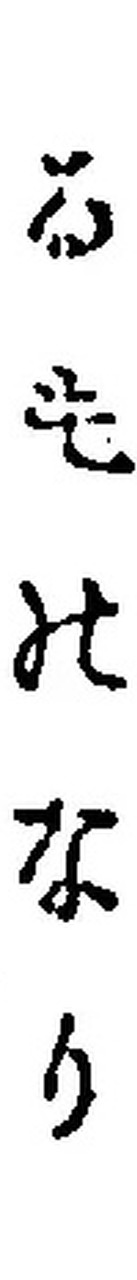るものなり

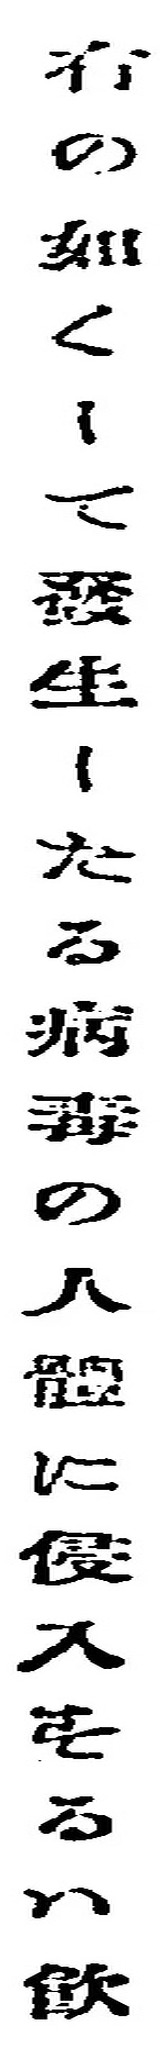右の如くして発生したる病毒の人体に侵入するは飲
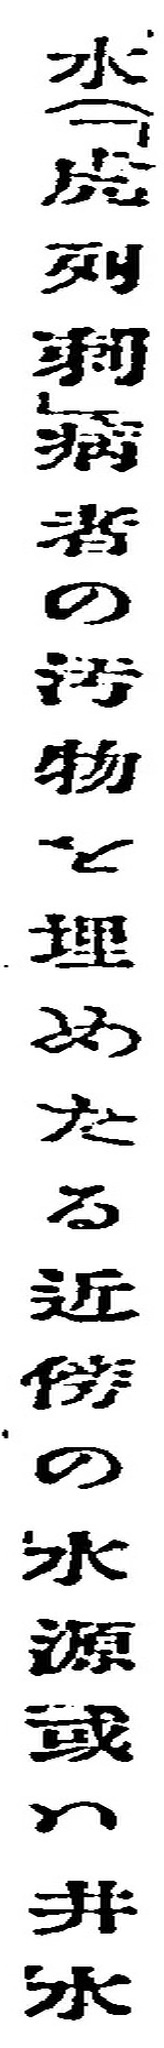水(「虎列刺」病者の汚物を埋めたる近傍の水源或は井水
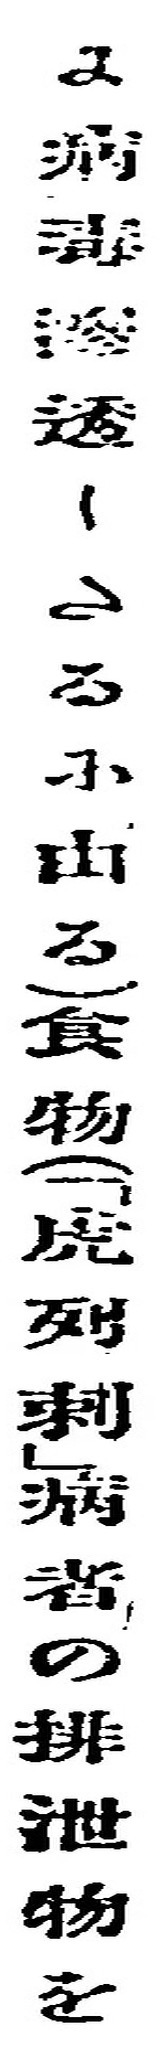に病毒滲透したるに由る)食物(「虎列刺」病者の排泄物を
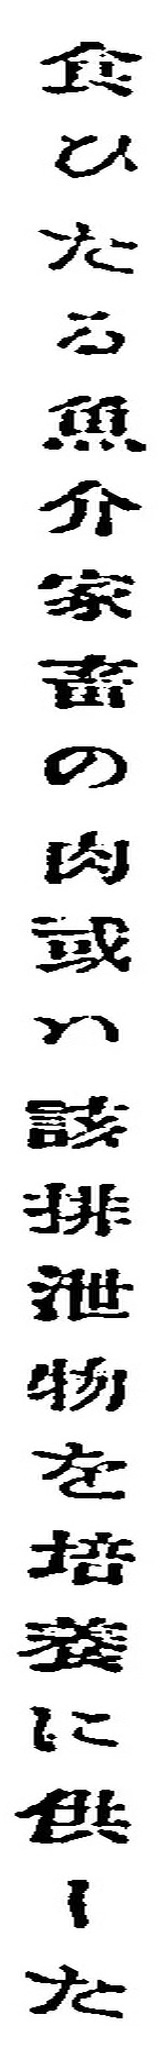食ひたる魚介家畜の肉或は該排泄物を培養に供した
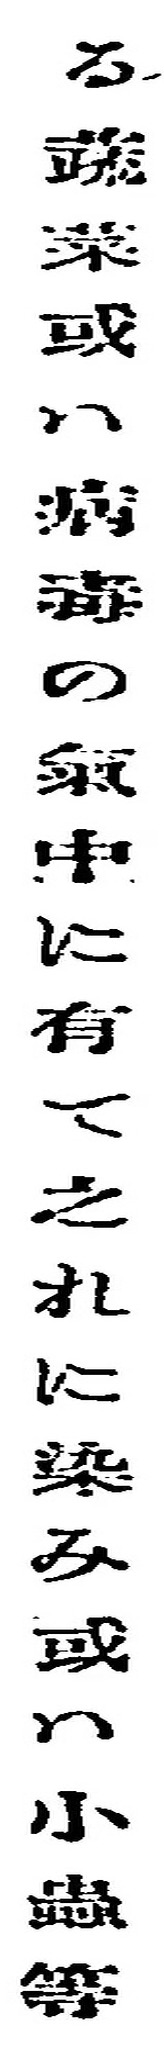る蔬菜或は病毒の気中に有て之れに染み或は小虫等
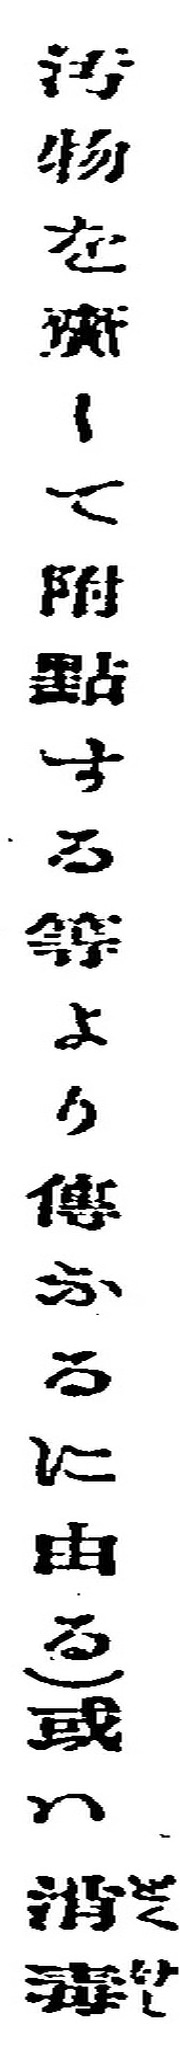汚物を齎して附点する等より伝ふるに由る)或は消毒
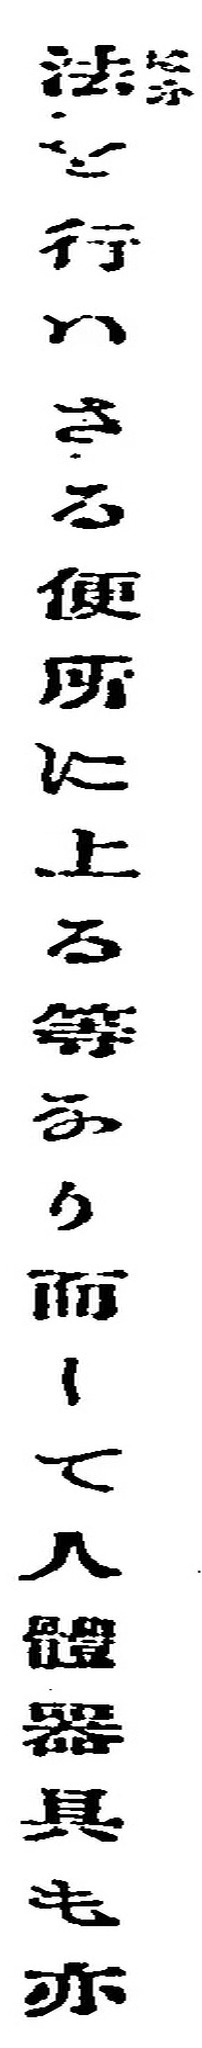法を行はさる便所に上る等なり而して人体器具も亦
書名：これら病予防心得
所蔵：国立国会図書館 National Diet Library, JAPAN
